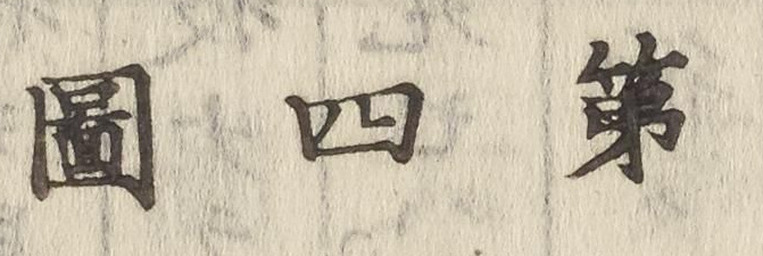第四図

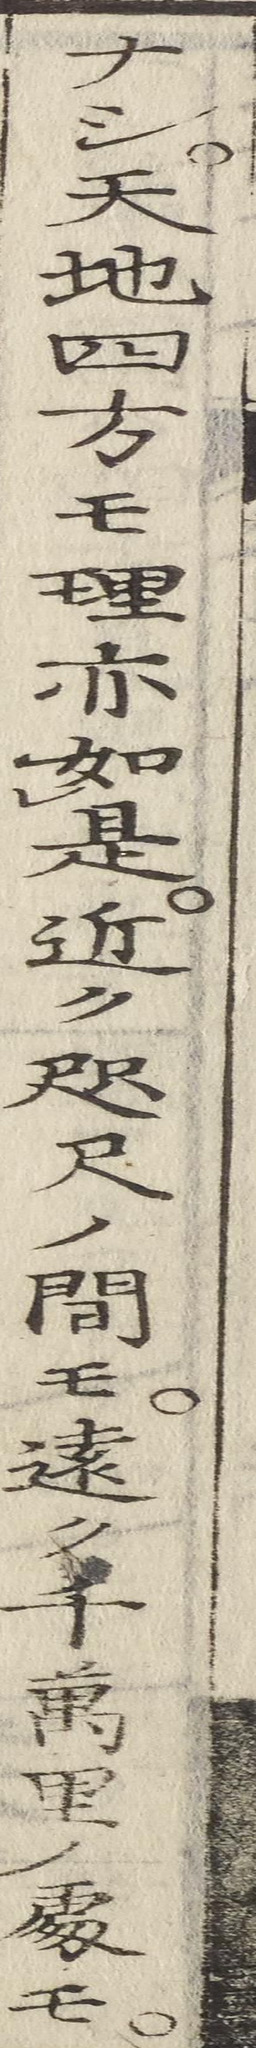ナシ。天地四方モ理亦如是。近ク咫尺ノ間モ。遠ク千万里ノ処モ。
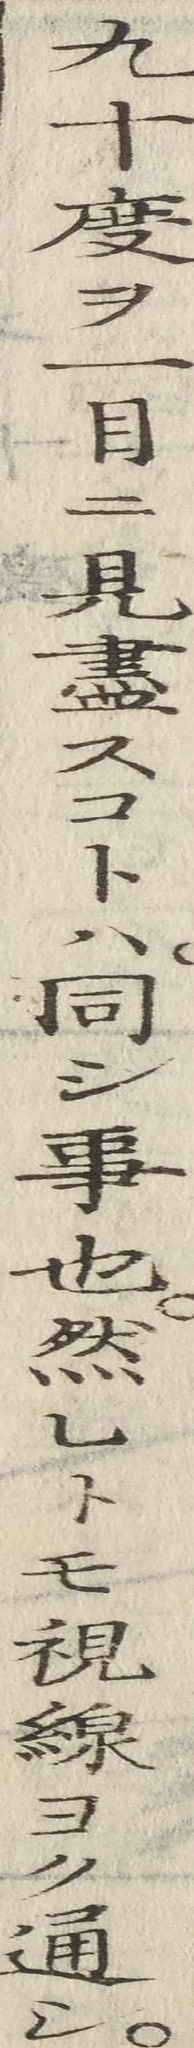九十度ヲ一目ニ見尽スコトハ。同シ事也。然レトモ視線ヨク通シ。
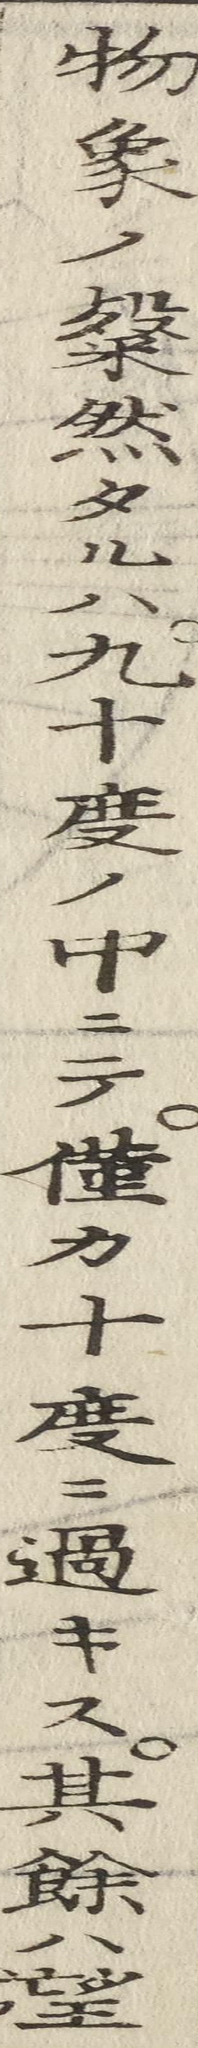物象ノ粲然タルハ。九十度ノ中ニテ。僅カ十度ニ過キス。其余ハ望
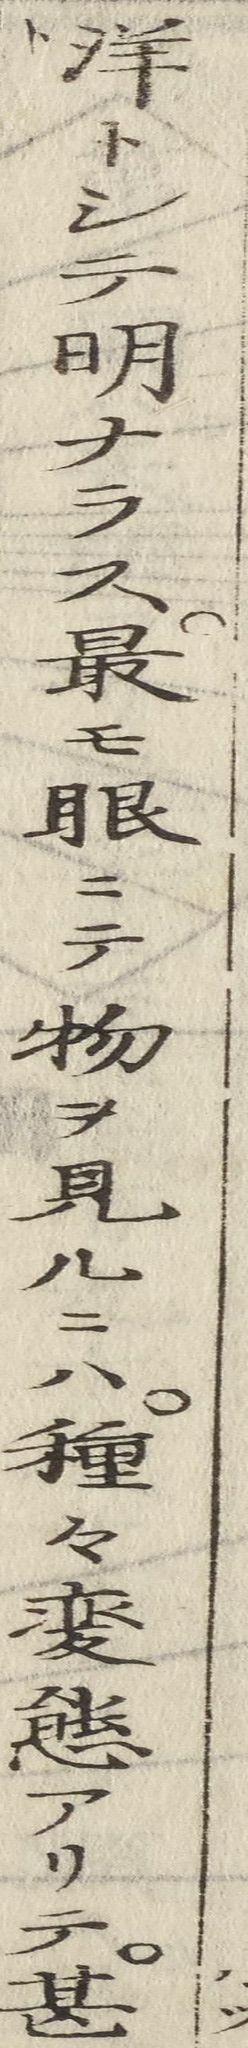洋トシテ明ナラス。最モ眼ニテ物ヲ見ルニハ。種々変態アリテ。甚
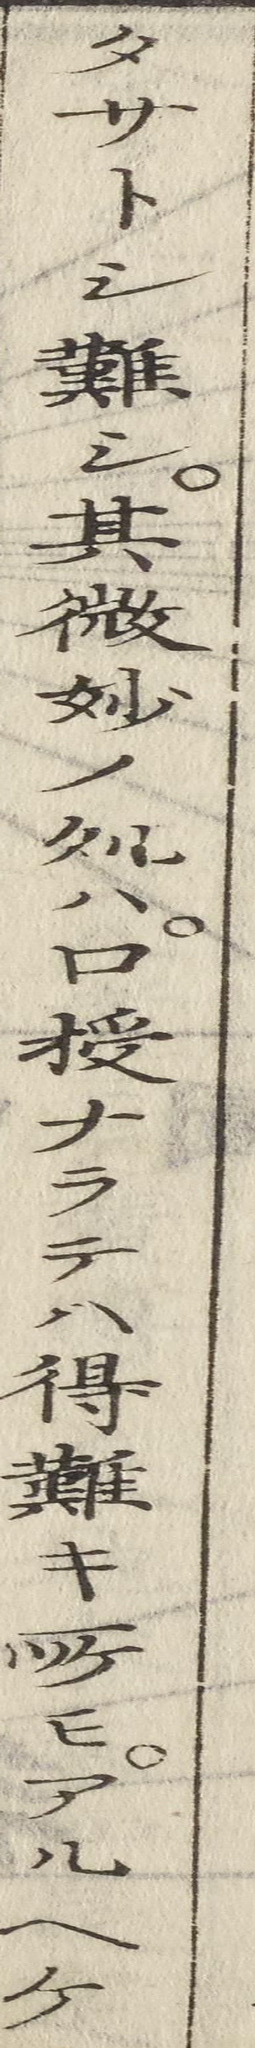タサトシ難シ。其微妙ノ処ハ。口授ナラテハ得難キ所モ。アルヘケ
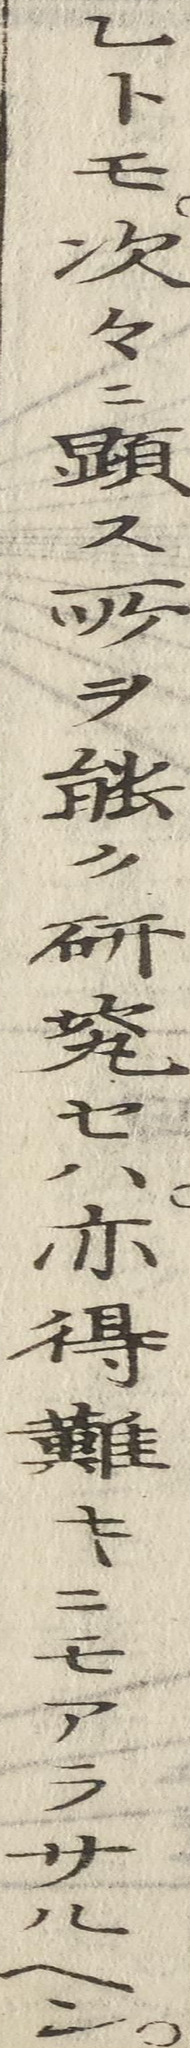レトモ。次々ニ顕ス所ヲ能ク研究セハ。亦得難キニモアラサルヘシ。
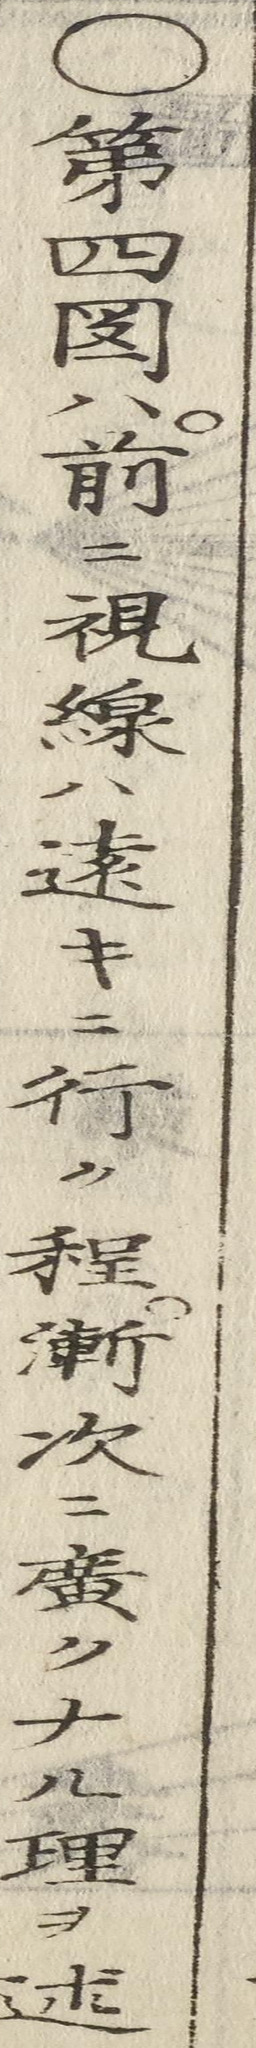○第四図ハ。前ニ視線ハ遠キニ行ク程。漸次ニ広クナル理ヲ述
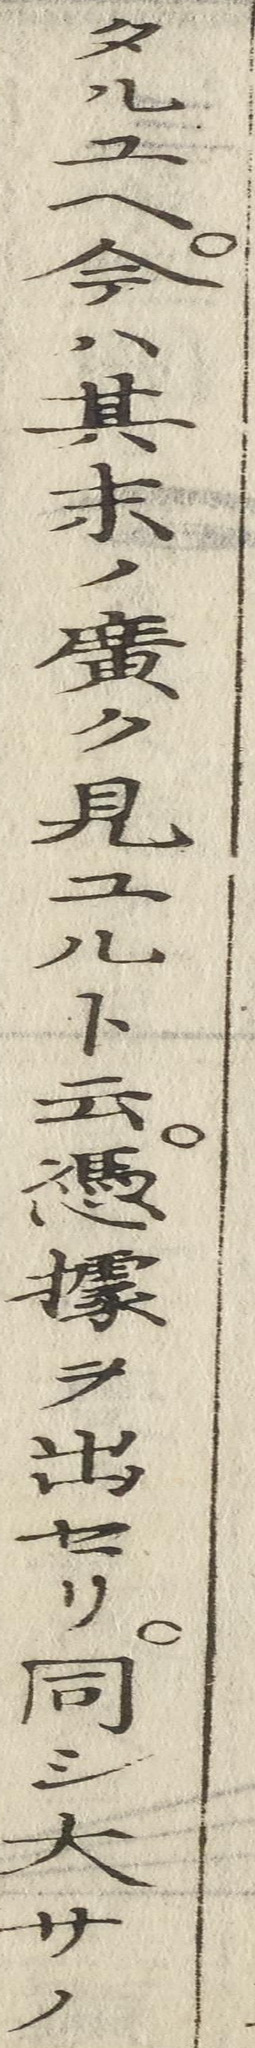タルユヘ。今ハ其末ノ広ク見ユルト云。憑拠ヲ出セリ。同シ大サノ
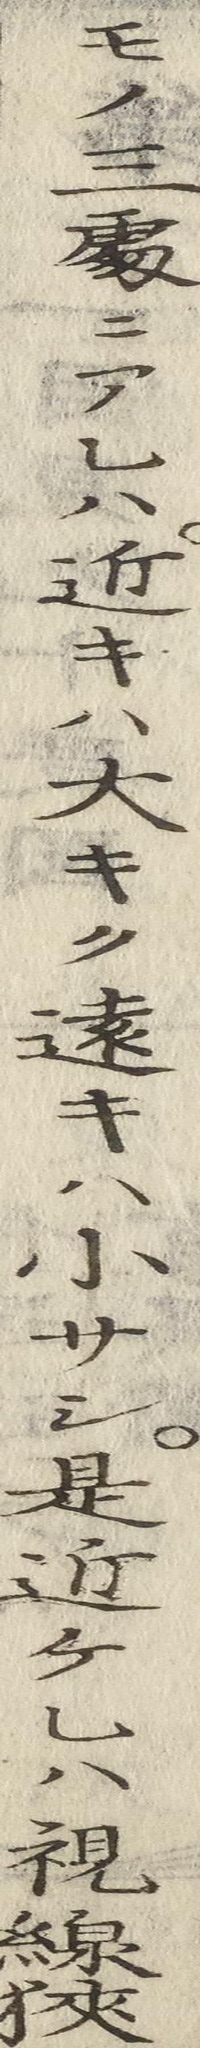モノ三処ニアレハ。近キハ大キク遠キハ小サシ。是近ケレハ視線狭
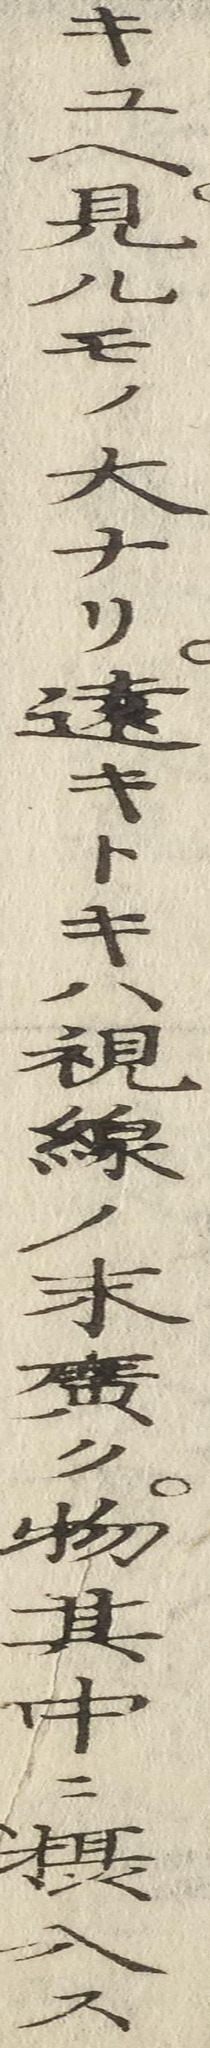キユヘ。見ルモノ大ナリ。遠キトキハ視線ノ末広ク。物其中ニ摂入ス
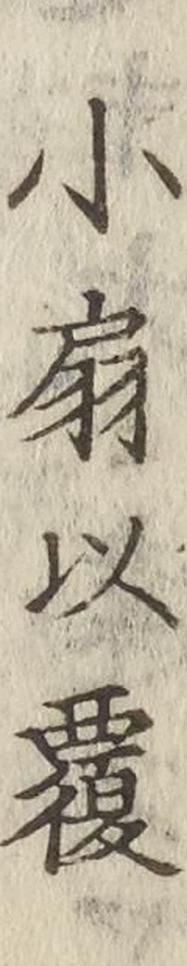小扇以覆
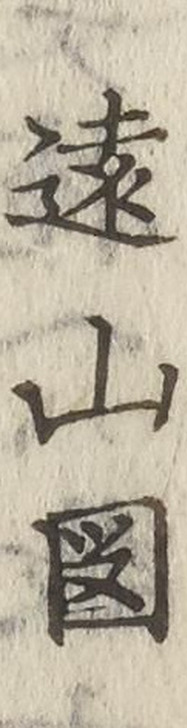遠山図
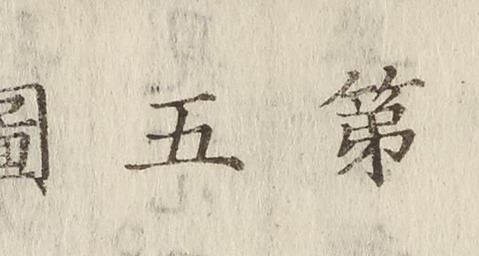第五図
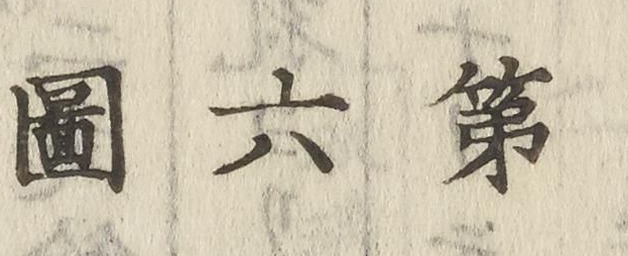第六図

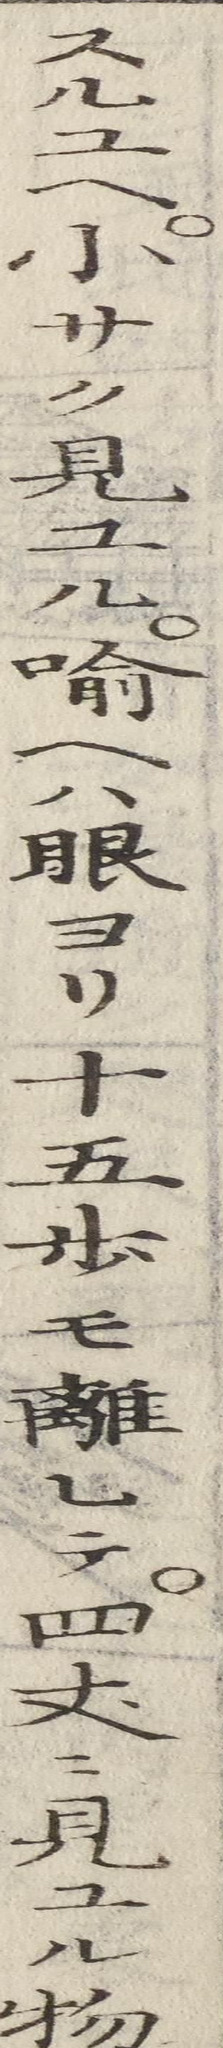スルユヘ小サク見ユル。喩ヘハ眼ヨリ十五歩モ離レテ。四丈ニ見ユル物。
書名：護法新論　上
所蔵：東京大学地震研究所図書室 Earthquake Research Institute Library, The University of Tokyo, JAPAN
